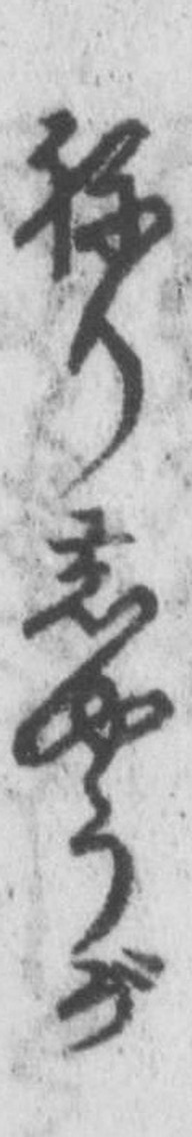ねりしやうが
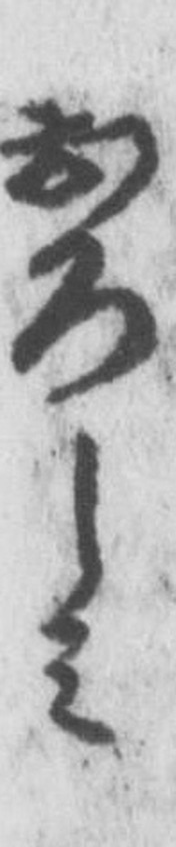おろしミ
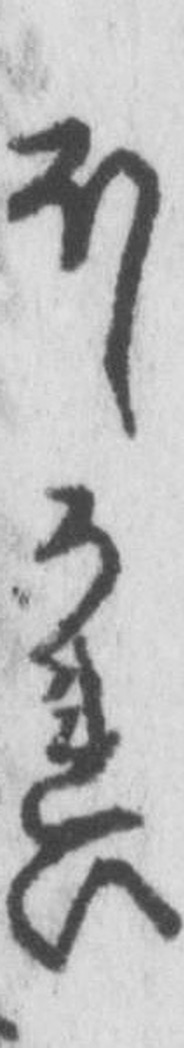ほしかれい
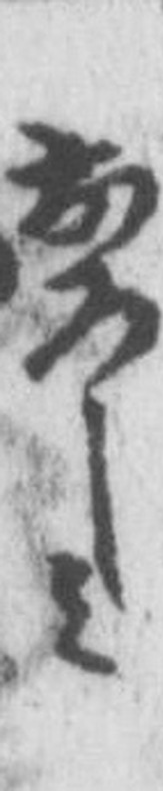おろしミ
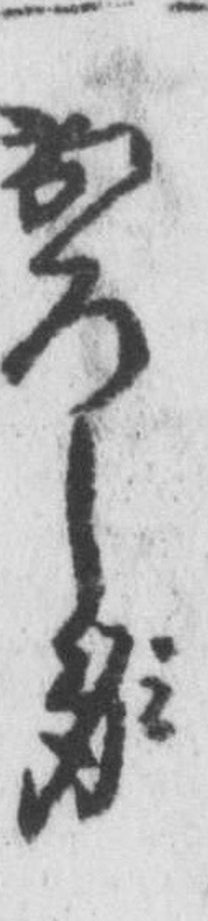おろしミ
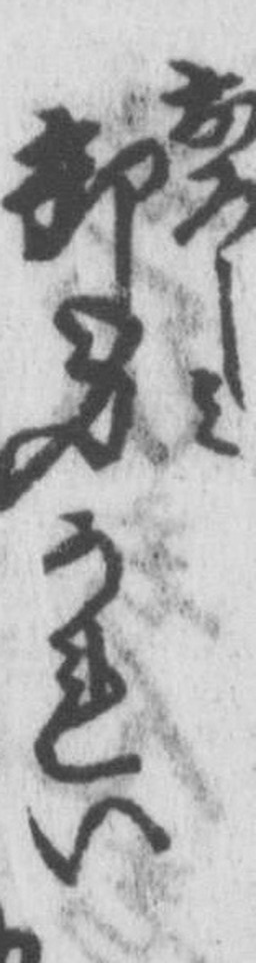卸身かれい
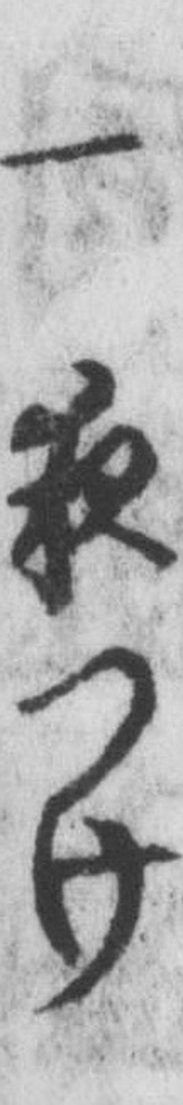一夜つけ
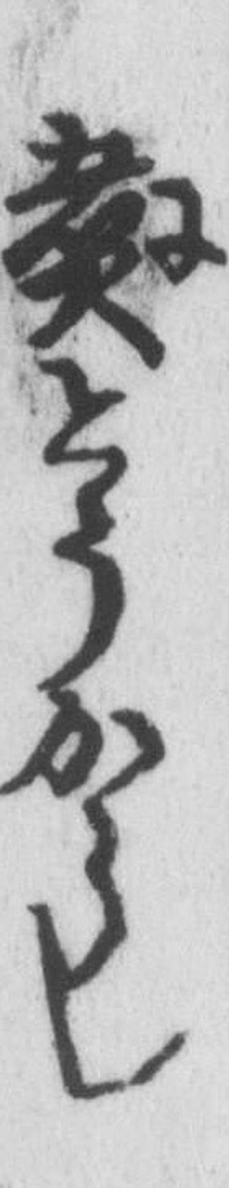煮どうからし
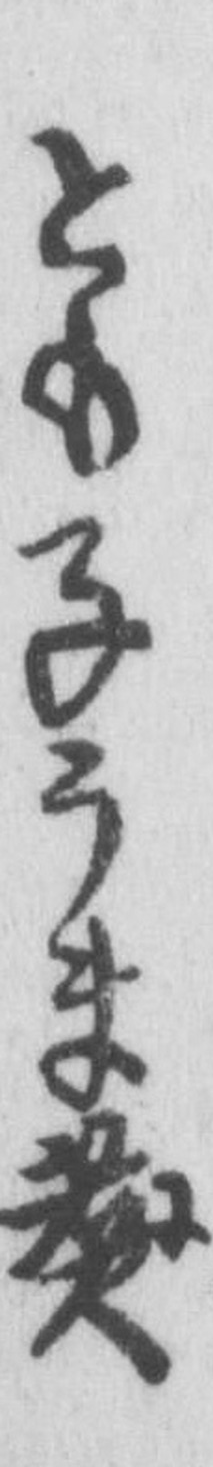ともねうま煮
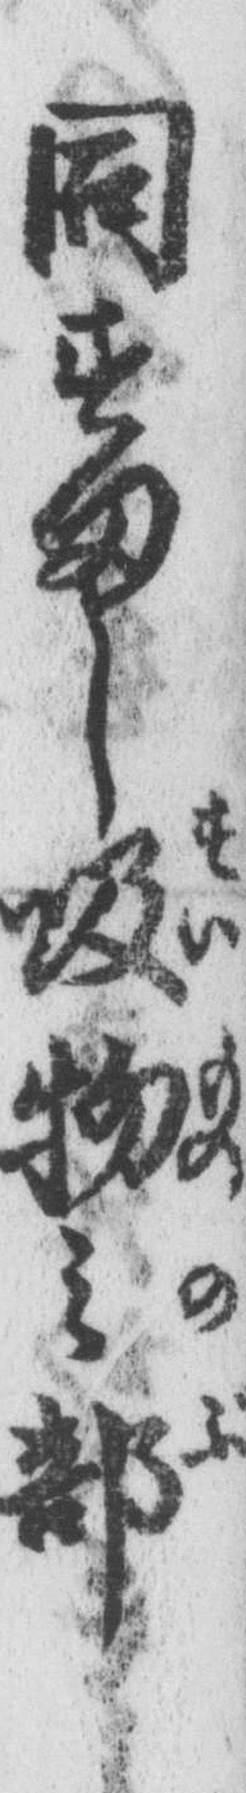同すまし吸物之部
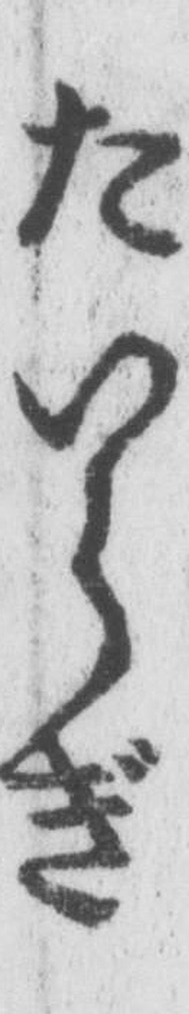たいらぎ
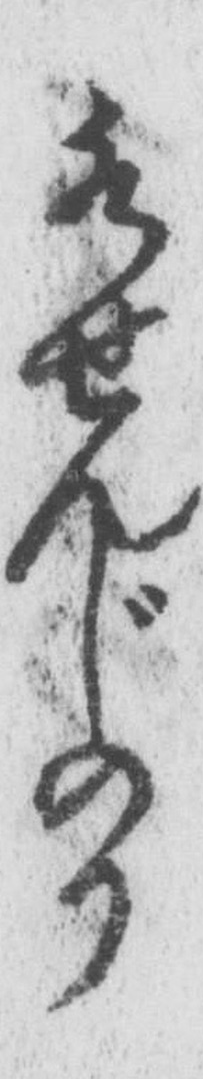水せんじのり
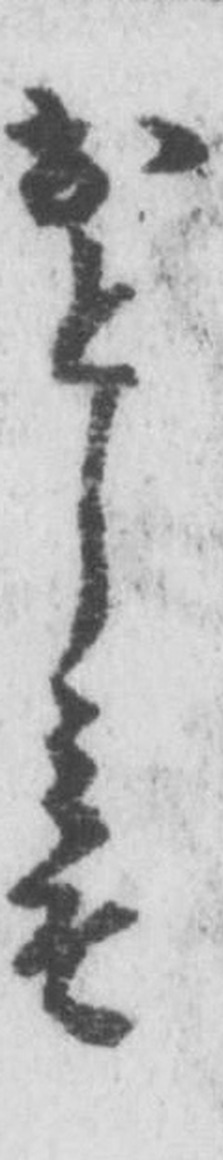おとしミそ
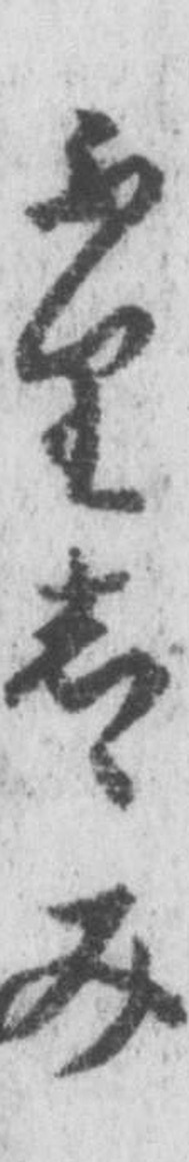ふりしゞみ
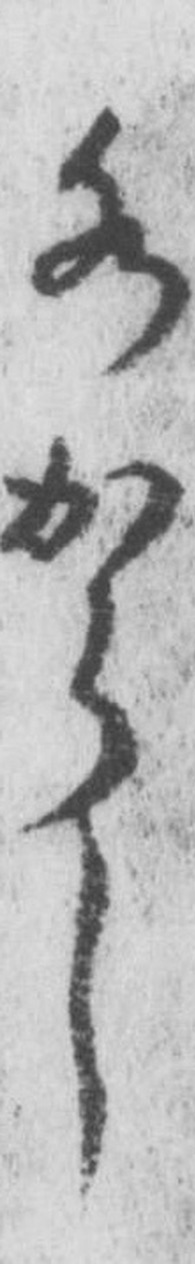水からし
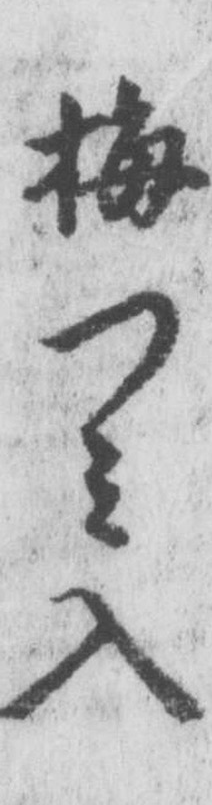梅つミ入
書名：当世料理献立
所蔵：大阪府立大学学術情報センター 国文学研究資料館
